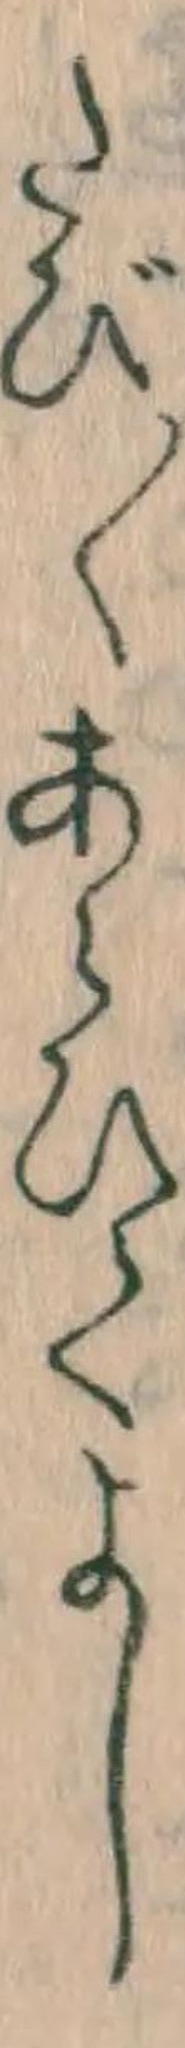たび〳〵あらひてよし
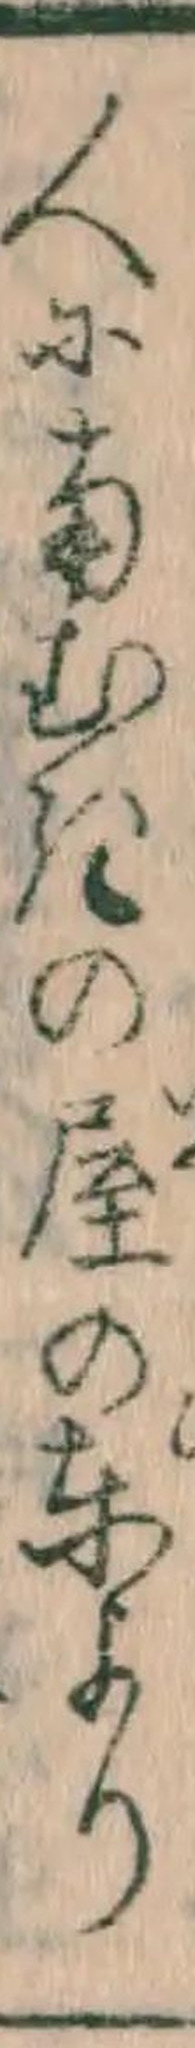人に南むきの屋の東より
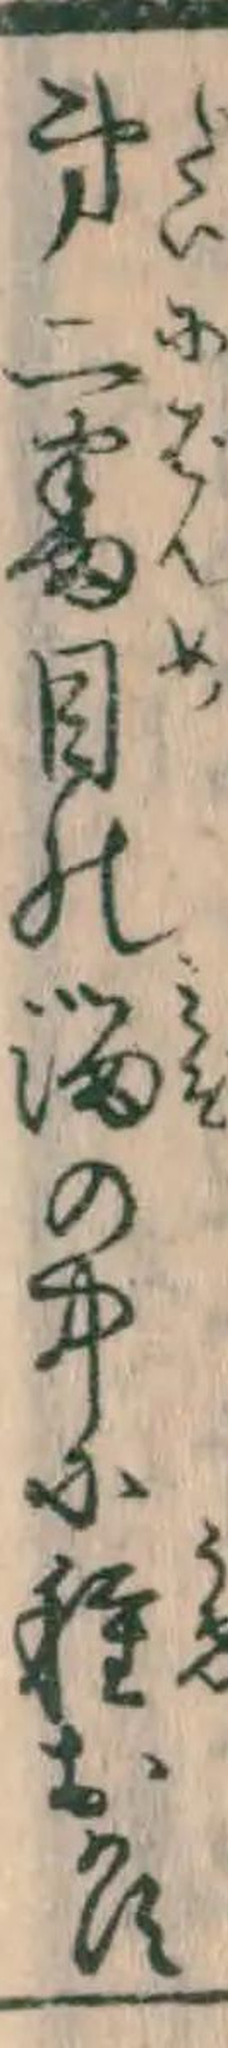第二番目の溜の中に種おかす
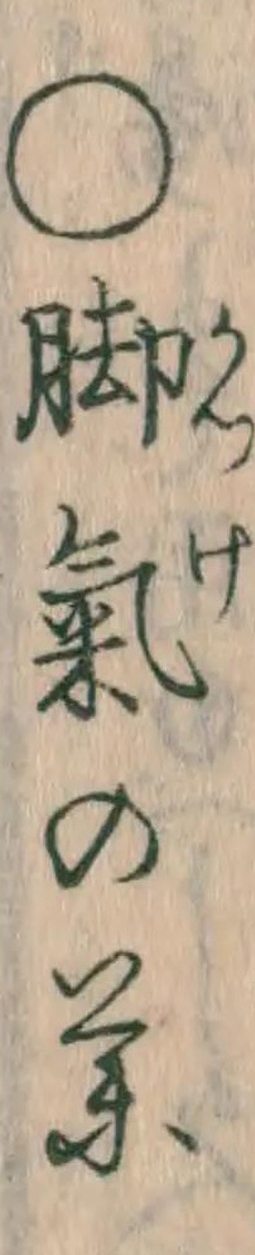○脚気の薬
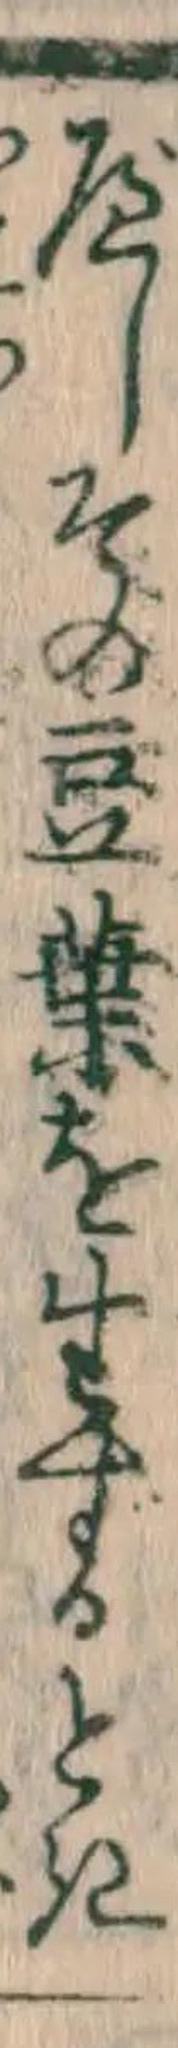べしその豆葉を生ずるとき
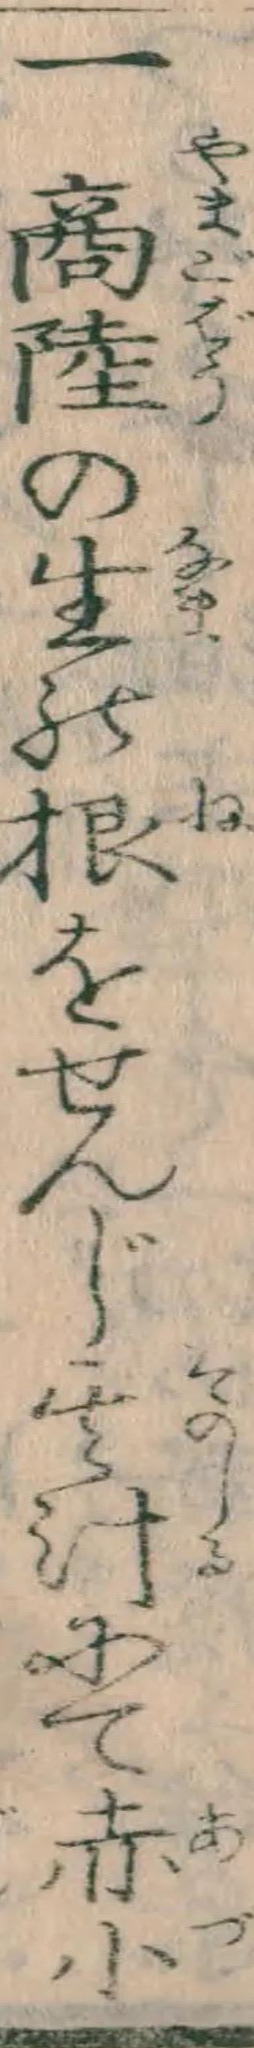一商陸の生の根をせんじ其汁にて赤小
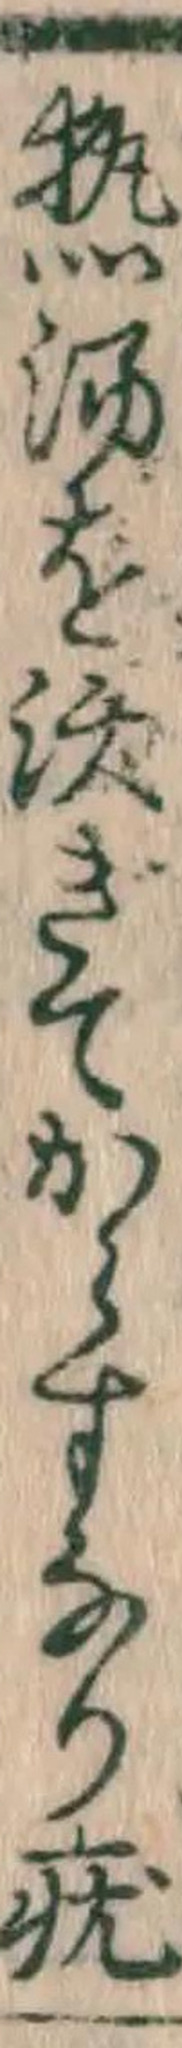熱湯を沃ぎてからすなり疣
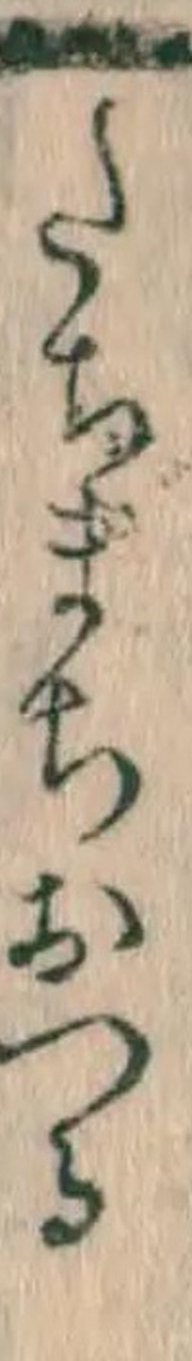たちまちおつる
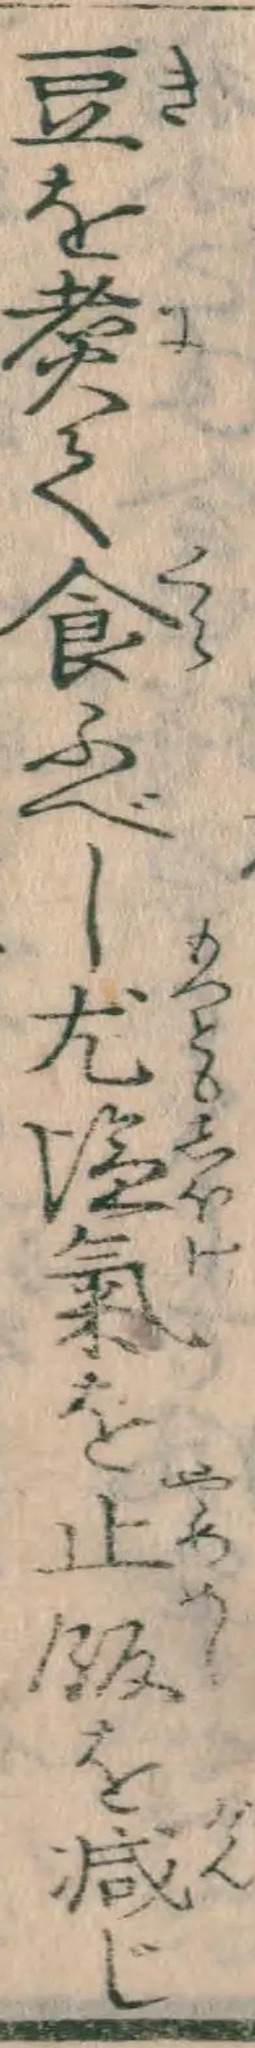豆を煮て食ふべし尤塩気を止飯を減じ
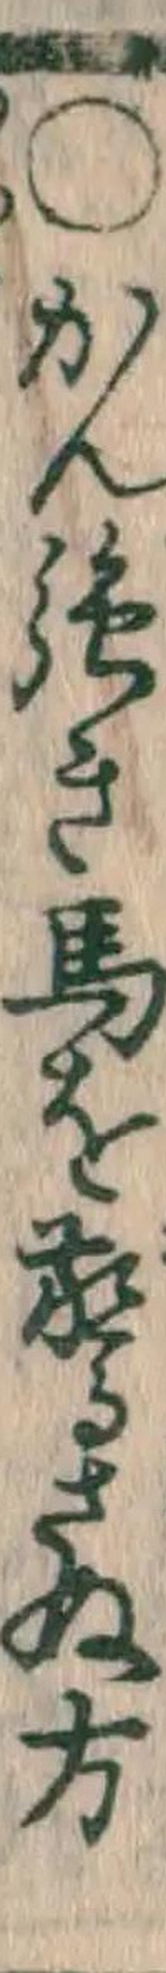○かん強き馬を驚さぬ方
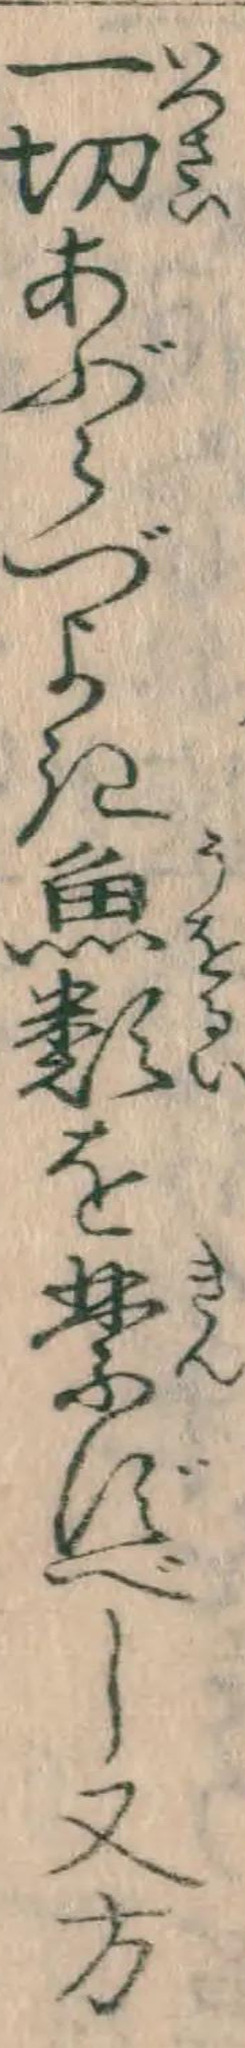一切あぶらづよき魚類を禁ずべし又方
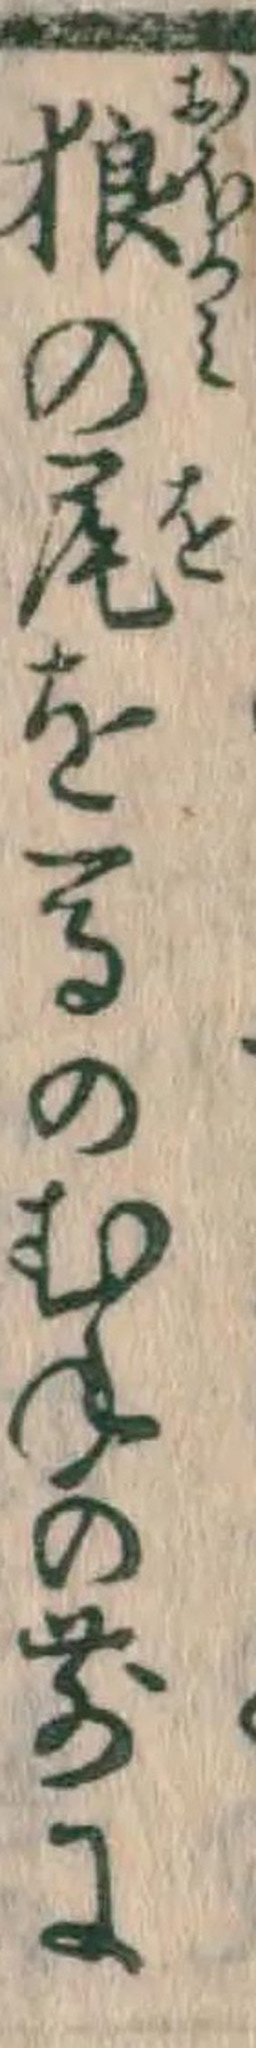狼の尾を馬のむねの前に
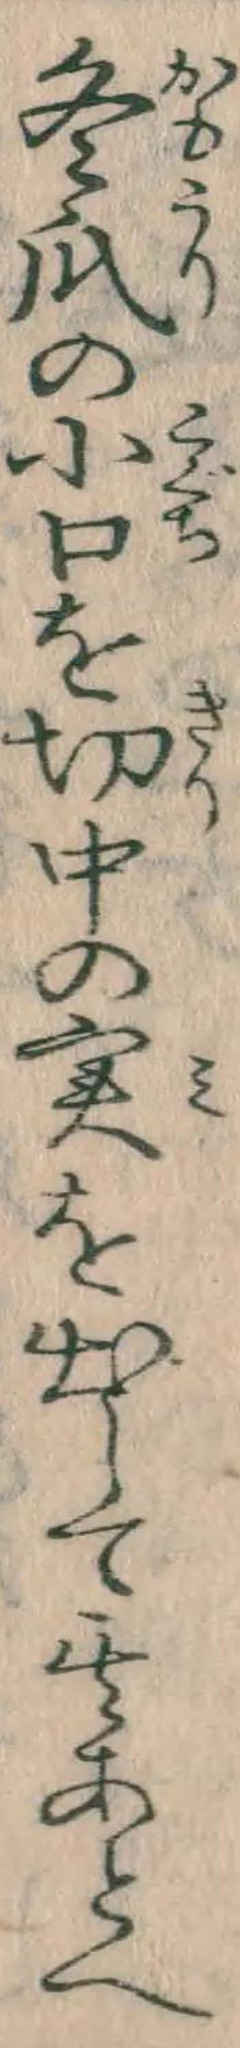冬瓜の小口を切中の実を出して其あとへ
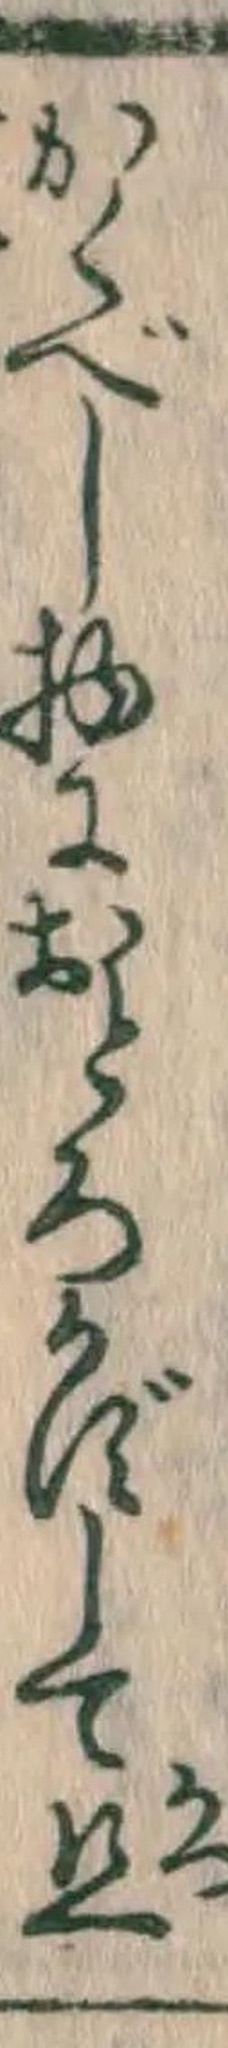かくべし物におとろかずして且
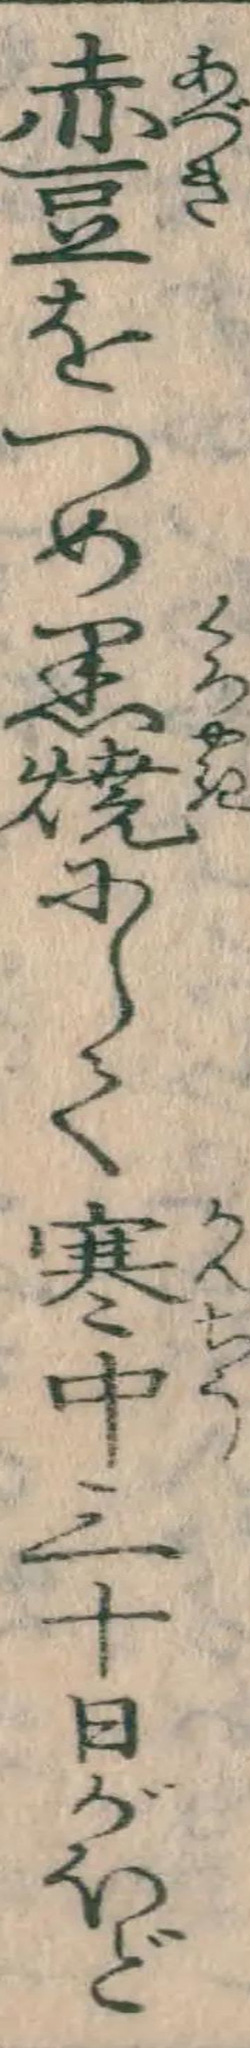赤豆をつめ黒焼にして寒中三十日がほど
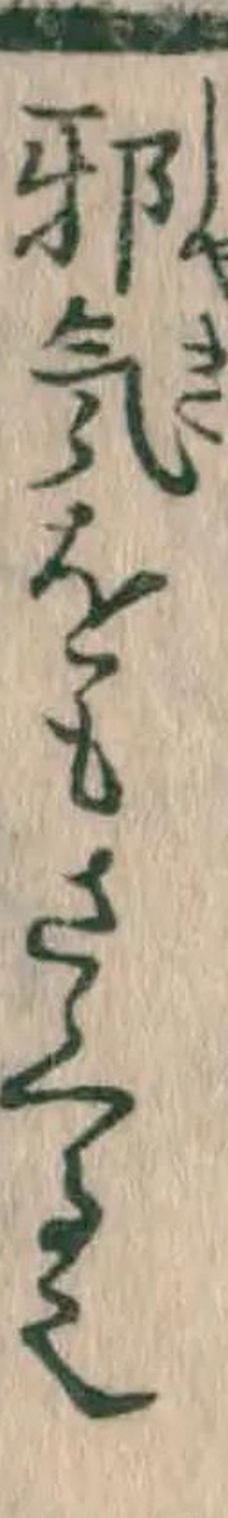邪気をもさくる也
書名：広益秘事大全 3巻. [4]
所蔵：国立国会図書館 National Diet Library, JAPAN
